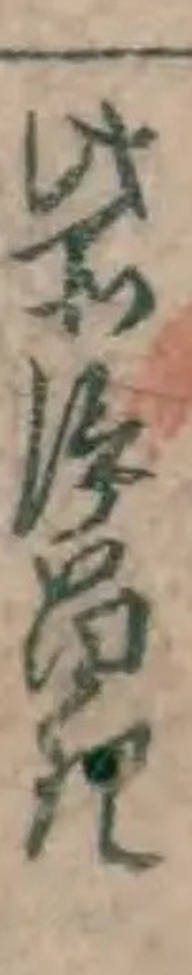此所浄留理
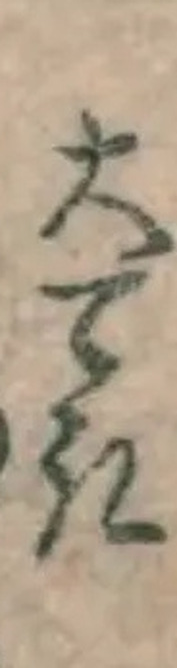大てき
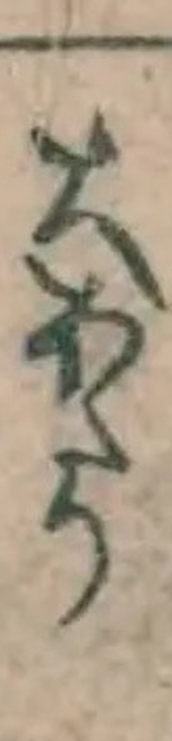大あたり
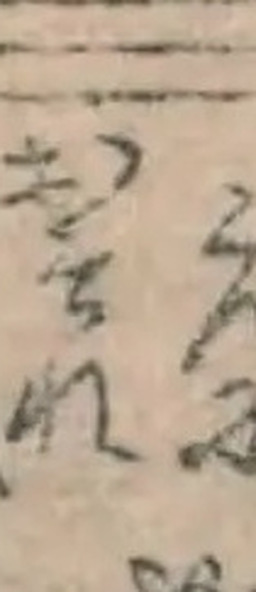おそれ
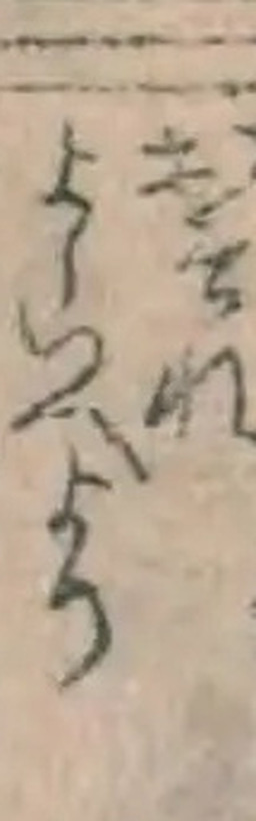よしいへより
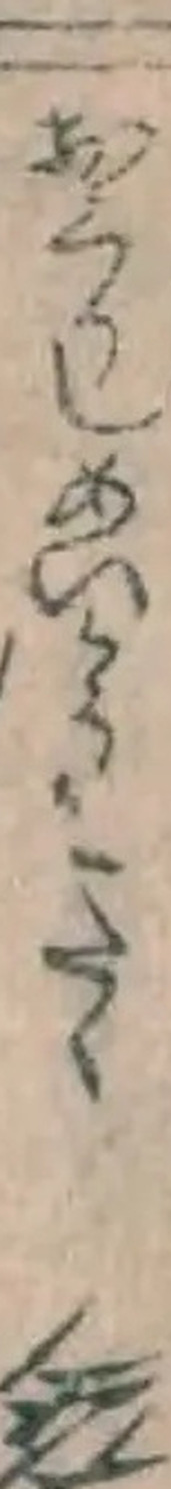おくりしめいこうをたく
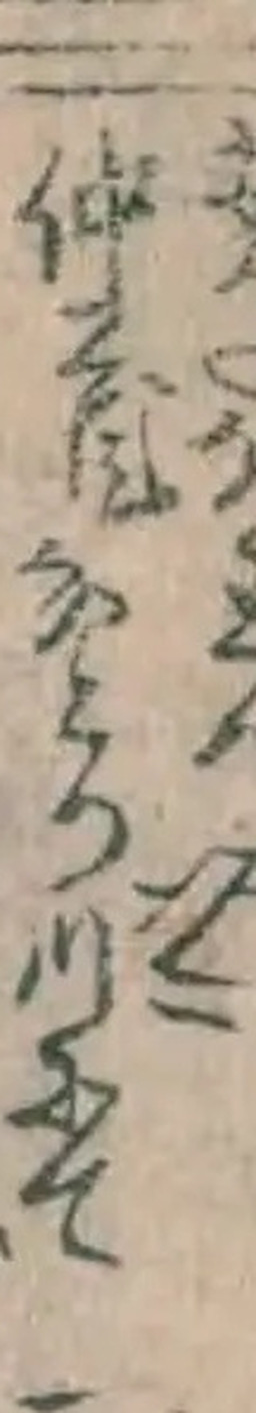仲蔵なとり川にて
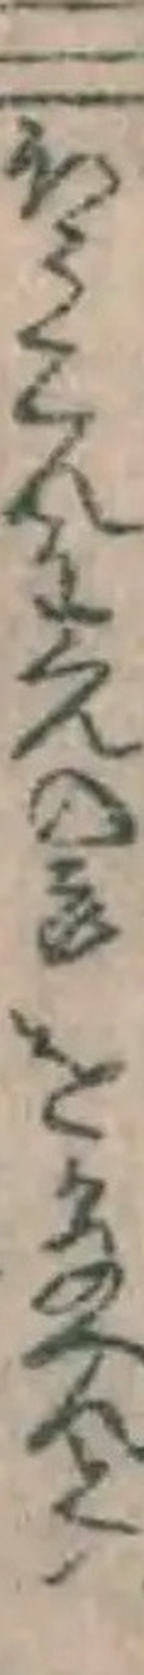ほうこん主くんのをかなへんと
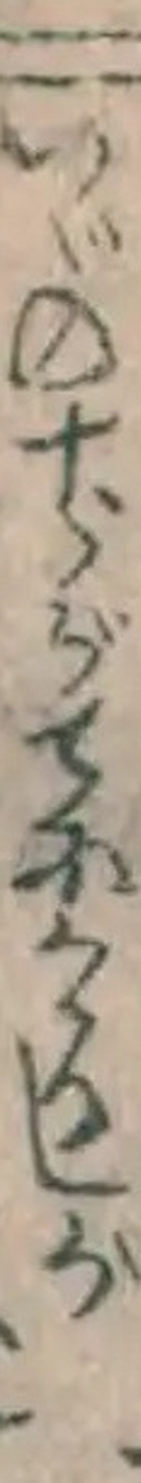いぐの十郎がてにかゝりしが
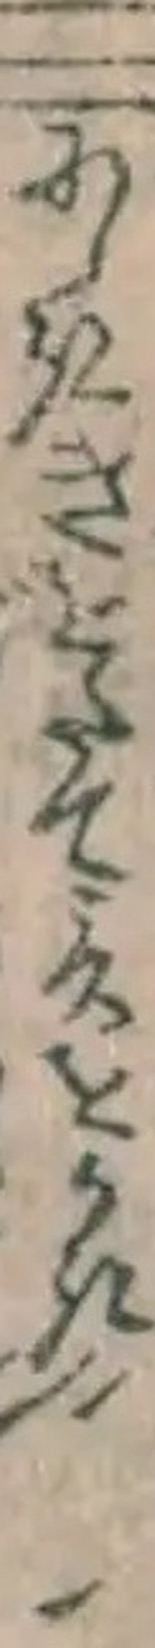にしきをたて歌をかき
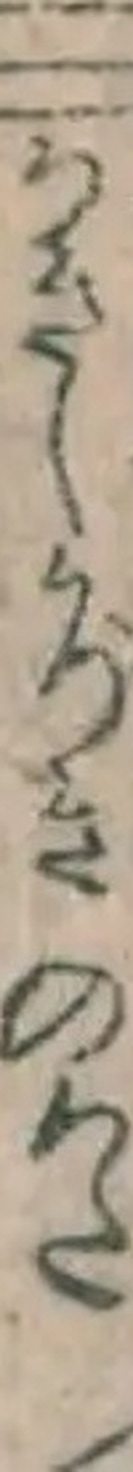かきしかづきのかた
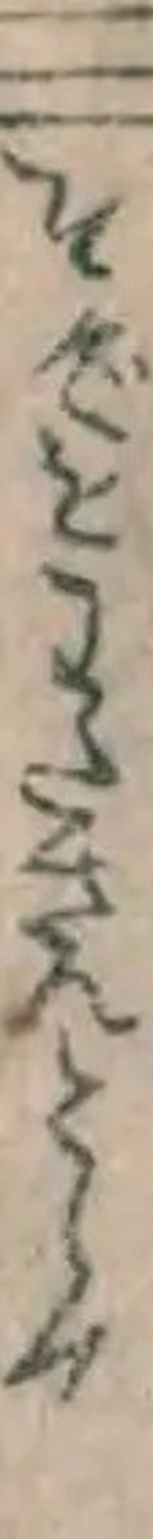そでをわたさんとして
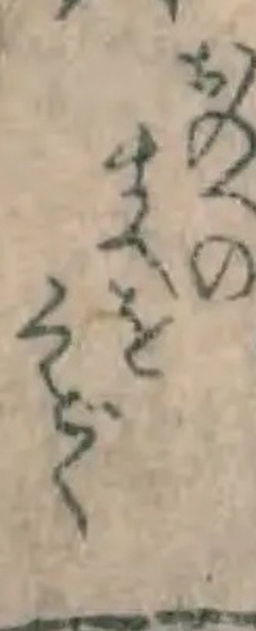くどく

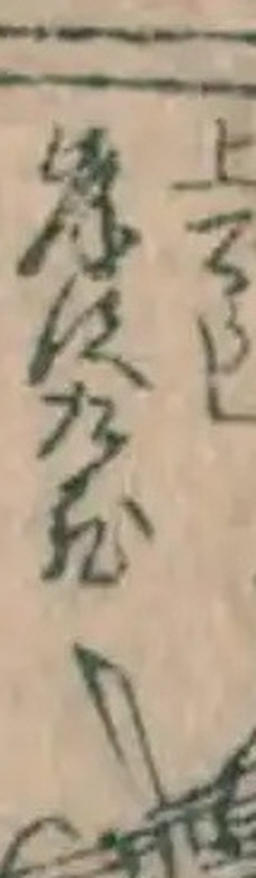岸沢九蔵
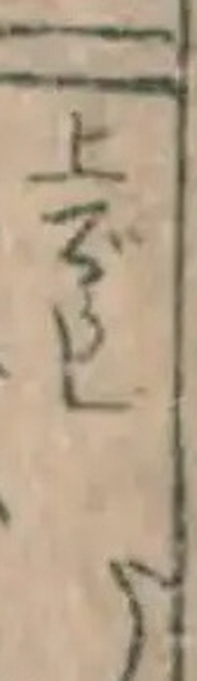上でうし
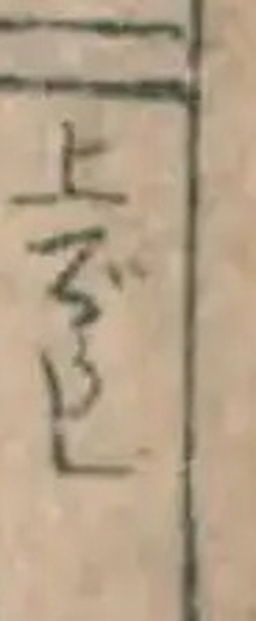上でうし
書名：伊達錦對将 : 森田座
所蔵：国立国会図書館 National Diet Library, JAPAN
